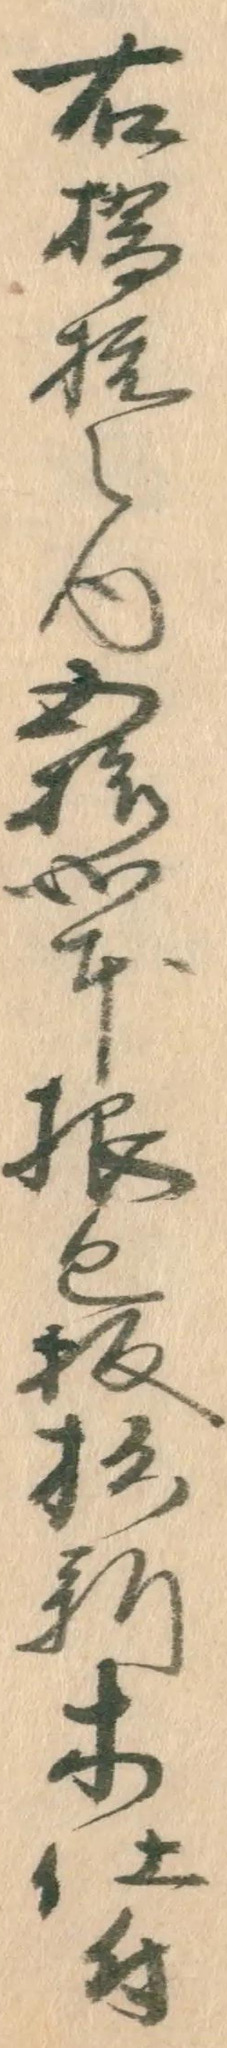右橋杭之間五拾弐本根包板杉新木仕付

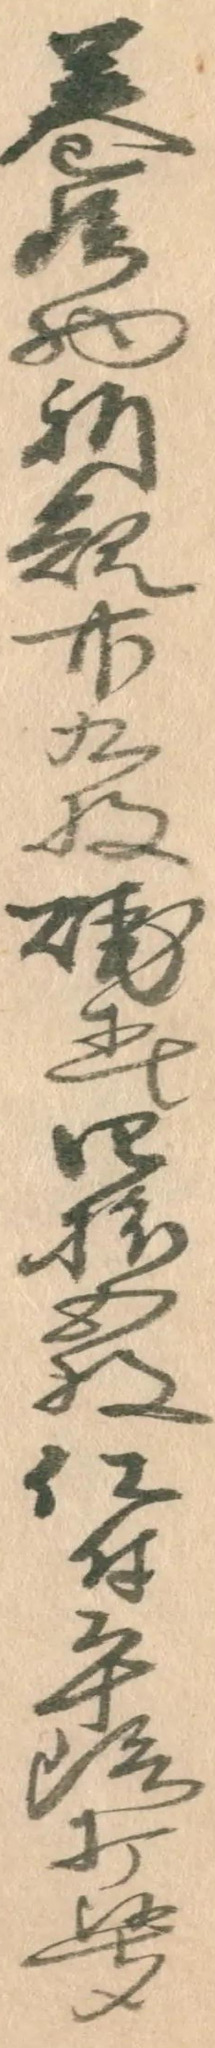巻鉄物新規廿九枚焼直し四拾五枚仕付平鋲打堅メ
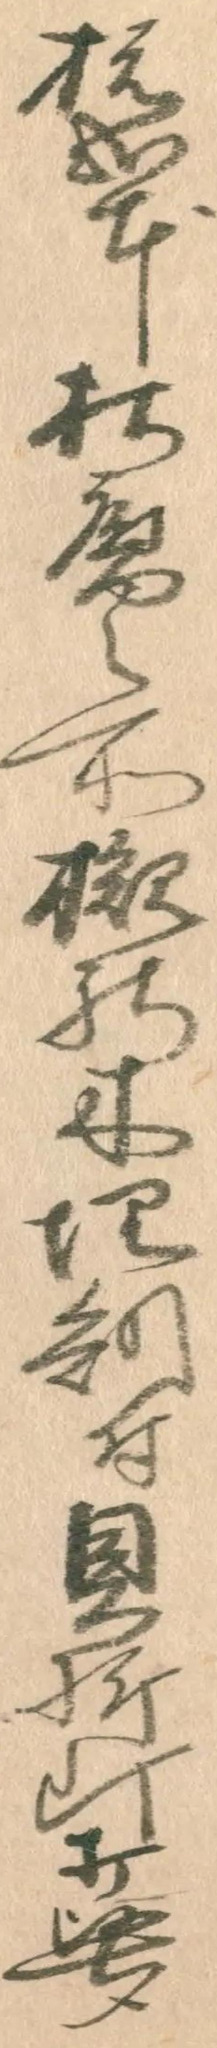杭弐本朽腐之所槻新木埋矧付貝折釘打堅メ
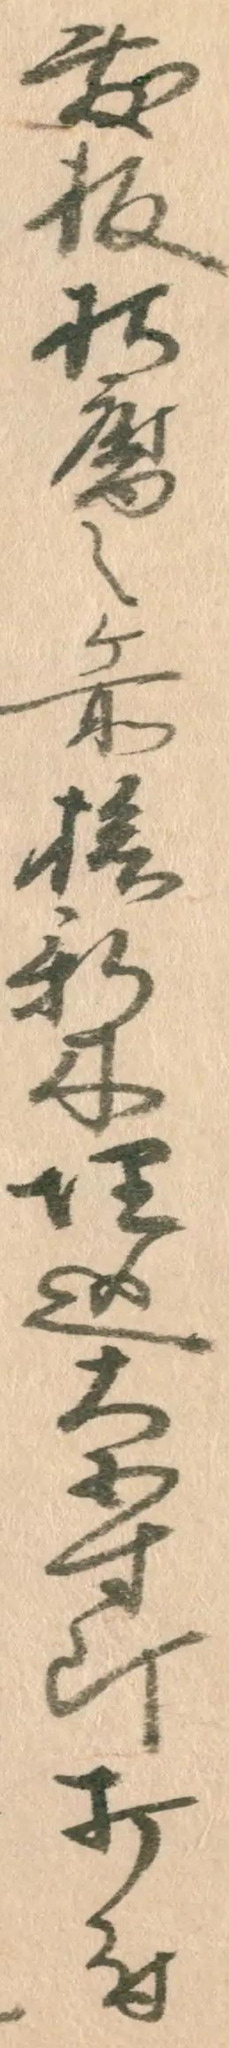敷板朽腐之ケ所桧新木埋込大五寸釘打付
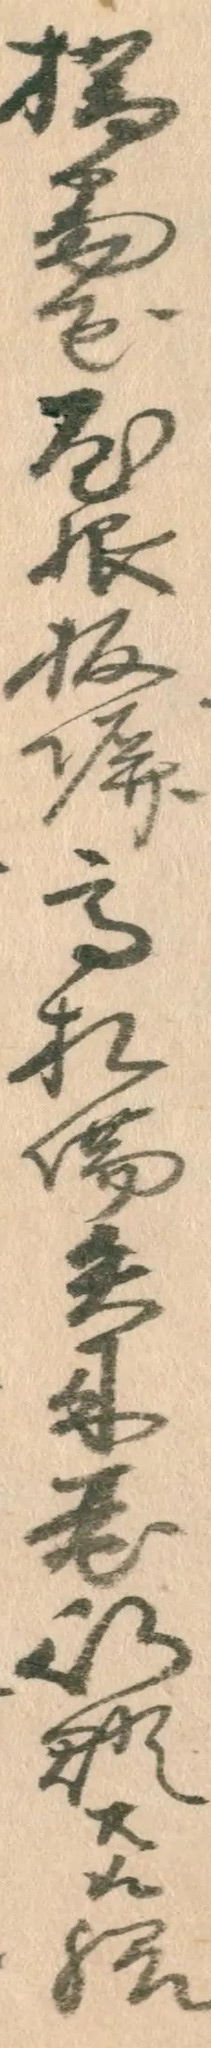橋番屋屋根板塀高札場矢来台行灯共脇
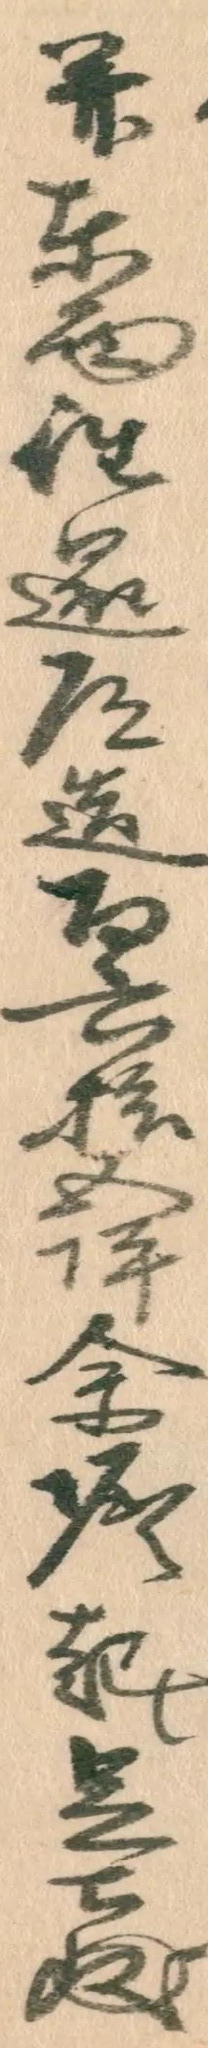并東西往還道造百六拾五坪余掘起し足土「致」
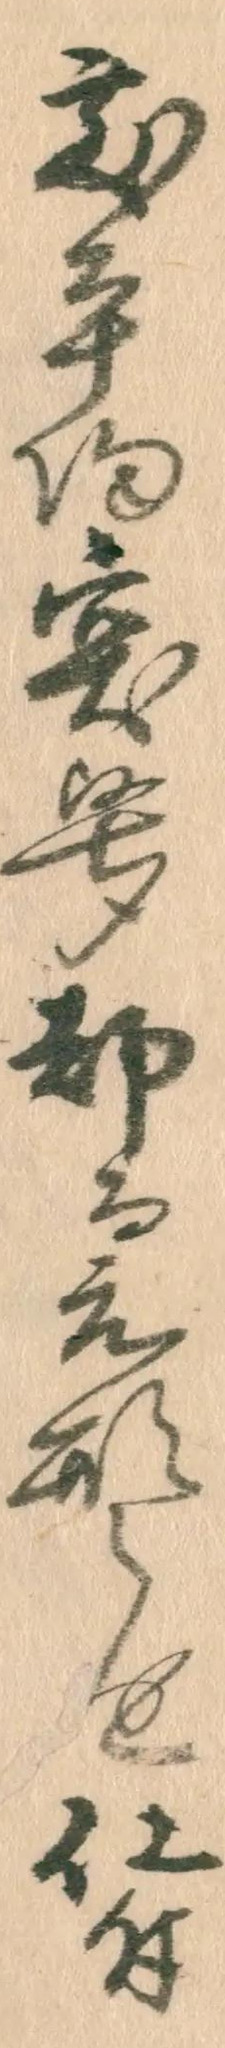敷平均突堅メ都而元形之通仕付
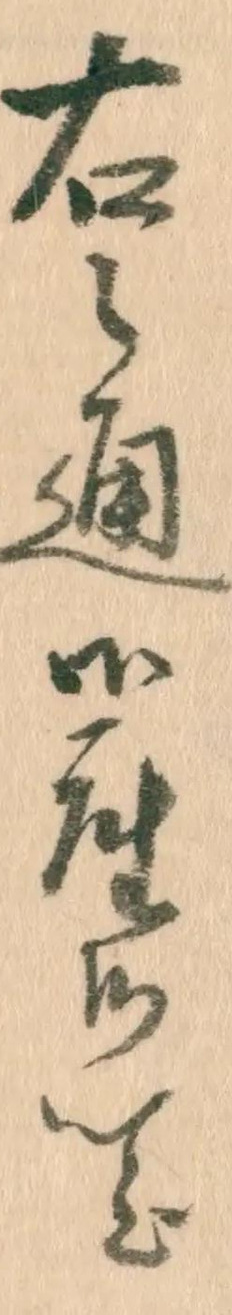右之通御座候以上
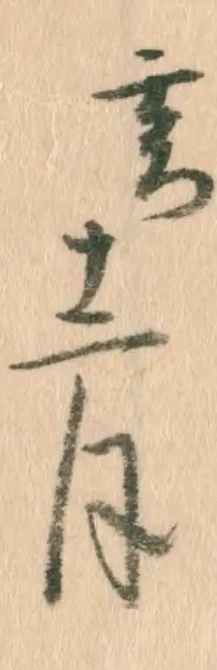亥十二月
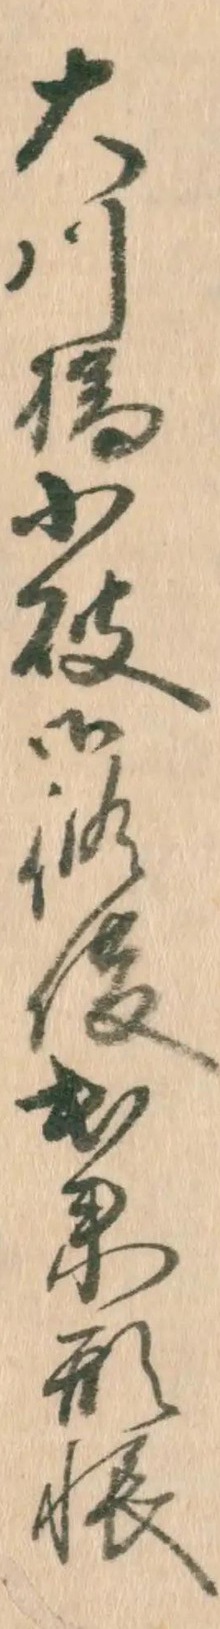大川橋小破御修復出来形帳
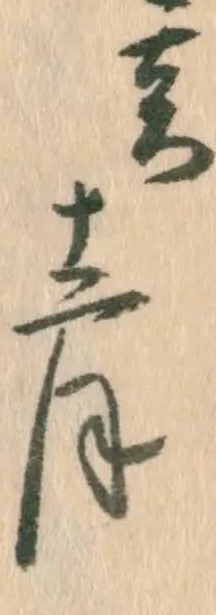亥十二月
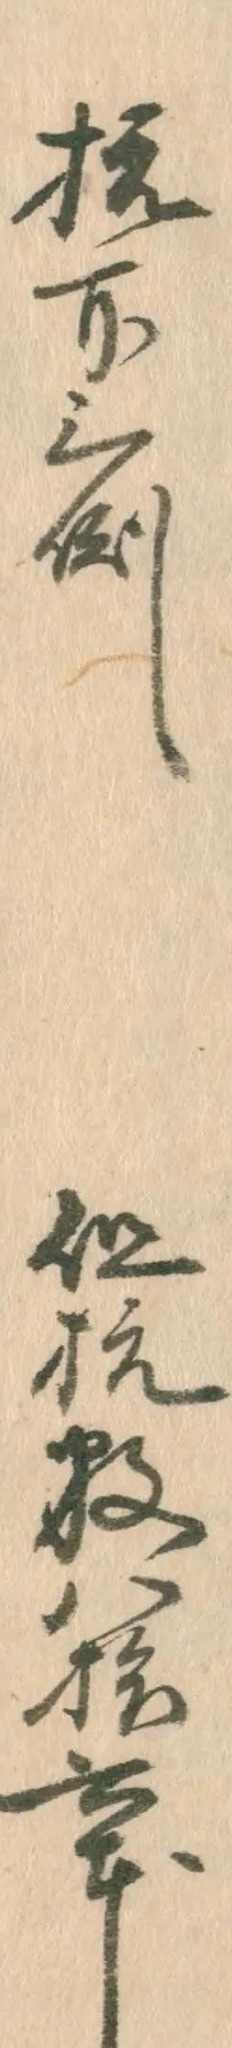杭廿三側但杭数八拾六本
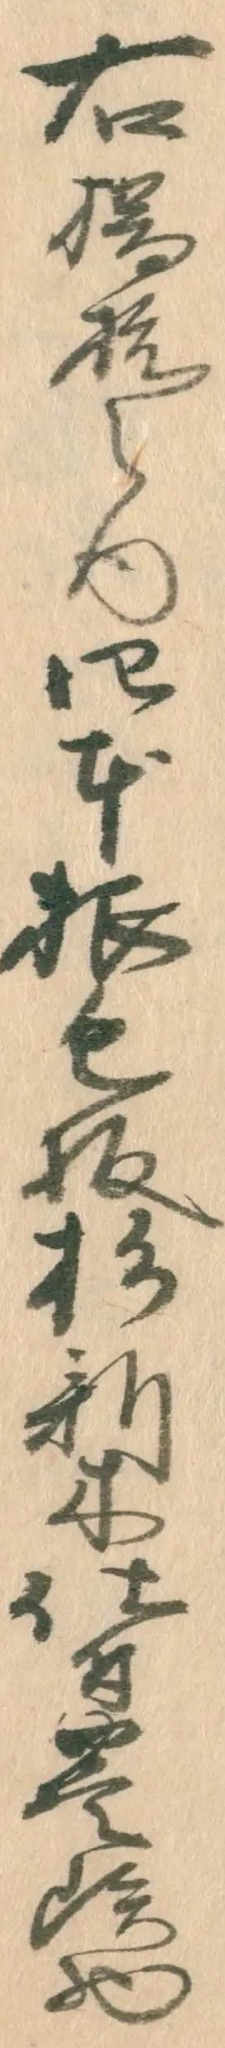右橋杭之間四本根包板杉新木仕付巻鉄物

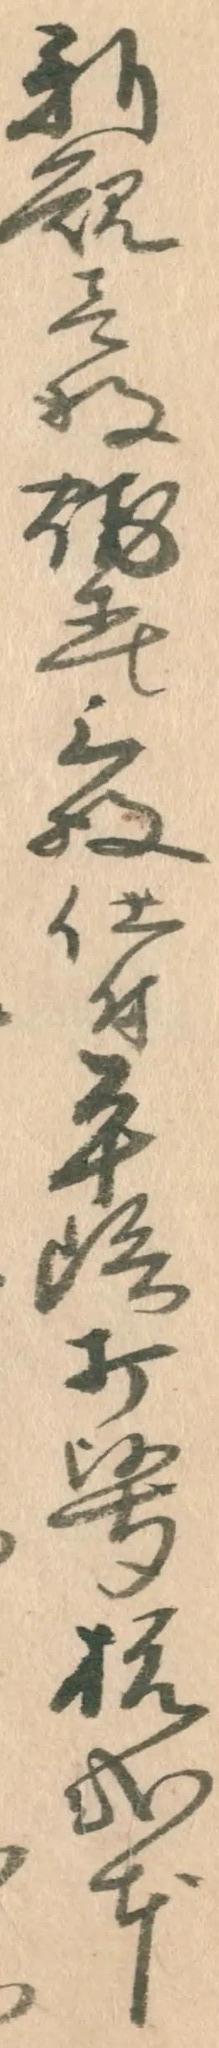新規壱枚焼直し三枚仕付平鋲打堅メ杭弐本
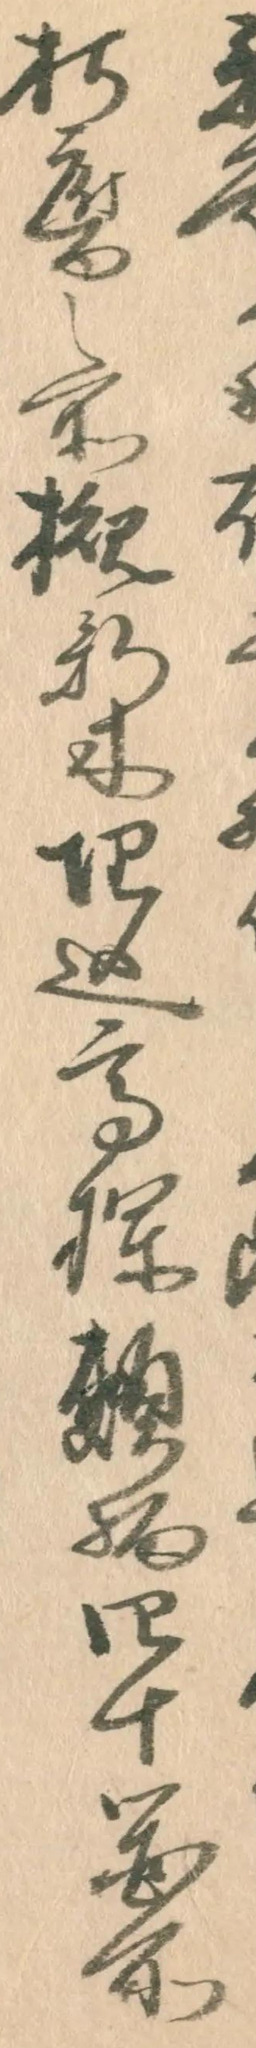朽腐之所槻新木埋込高欄頬柄四十箇所
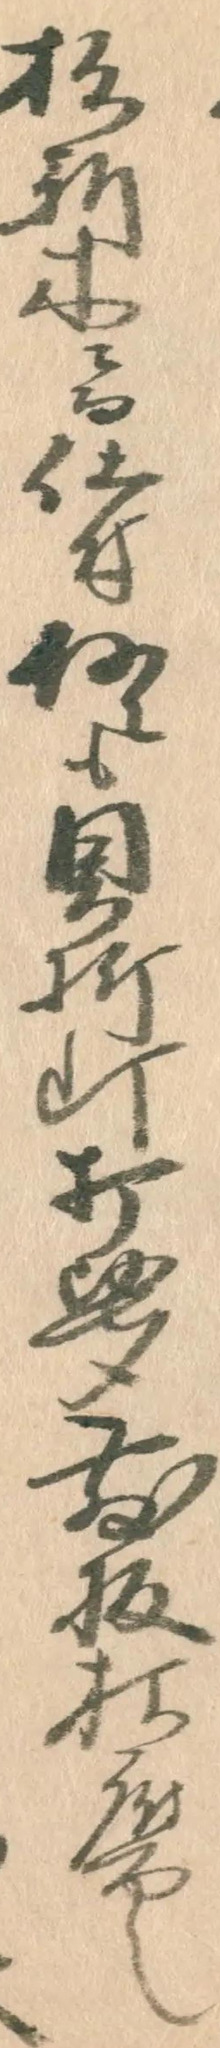杉新木ニ而仕付何レも貝折釘打堅メ敷板朽腐之
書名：三橋 17巻. [7] 三橋小破御修復書留　但御奉行御掛リ替地震潰橋番屋　嘉永四亥年より安政二卯年迄　上
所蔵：国立国会図書館 National Diet Library, JAPAN
